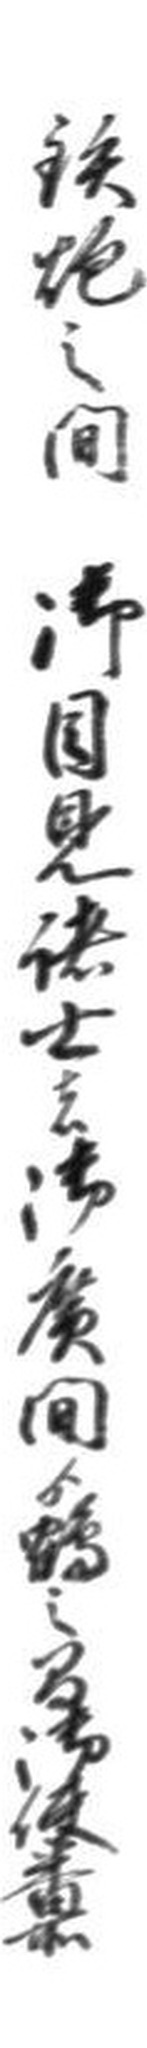鉄砲之間御目見諸士者御広間ゟ鶴之間御使番所

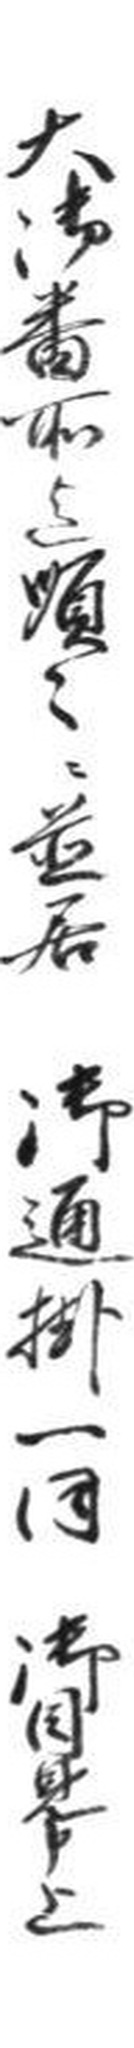大御番所迄順々ニ並居御通掛一同御目見申上
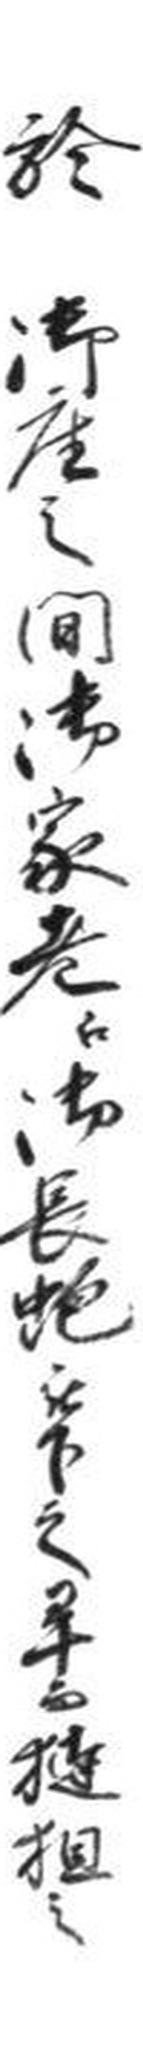於御座之間御家老江御長蚫被下之畢而㺚狚之
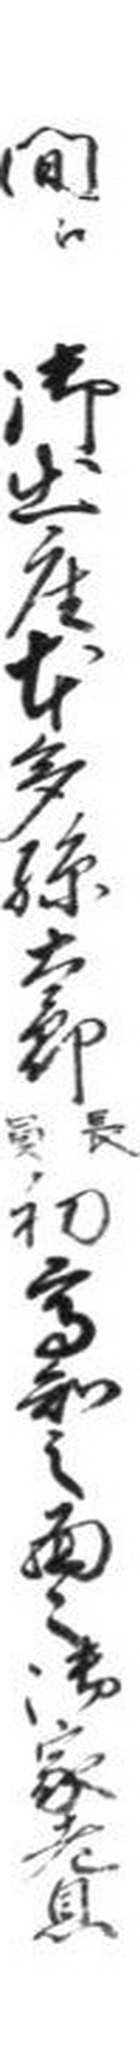間江御出座本多孫太郎長員初高知之面々御家老息
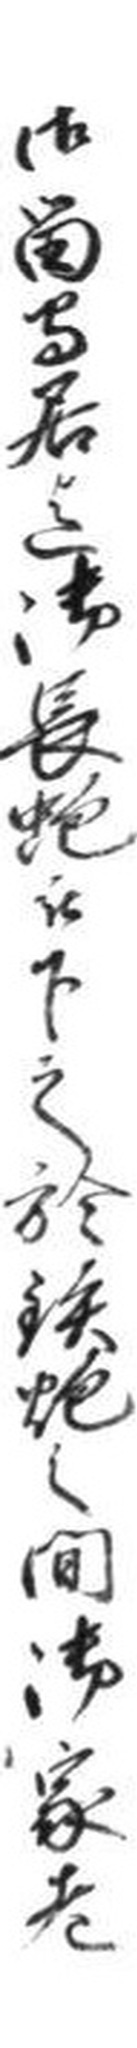御留守居迄御長蚫被下之於鉄炮之間御家老
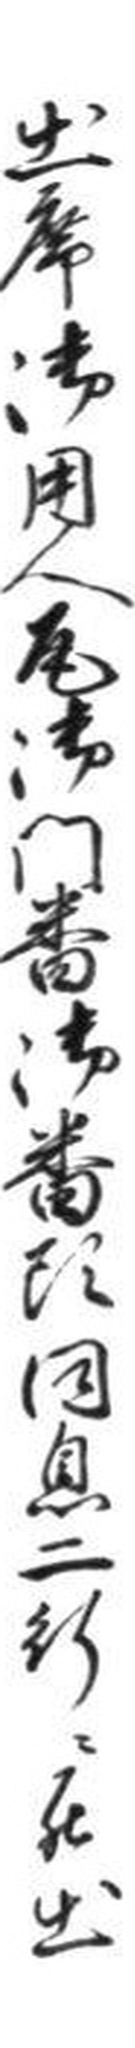出席御用人瓦御門番御番頭同息ニ行ニ罷出
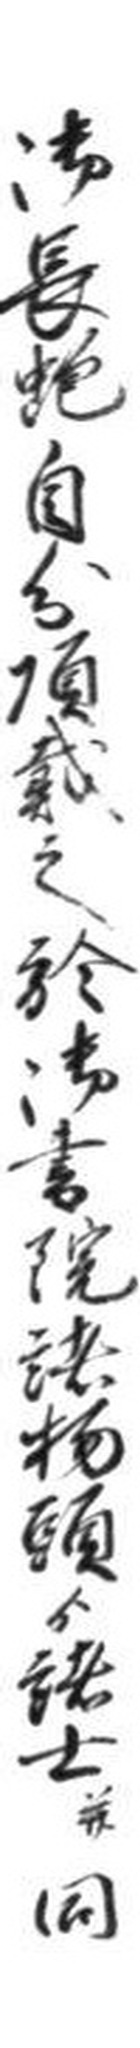御長蚫自分頂戴之於御書院諸物頭ゟ諸士并同
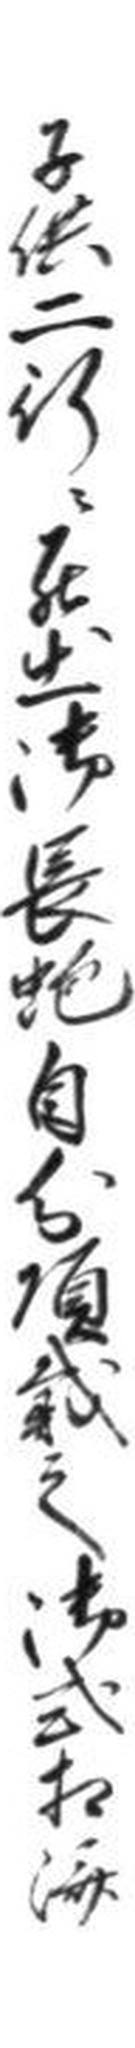子供二行ニ罷出御長蚫自分頂戴之御式相済
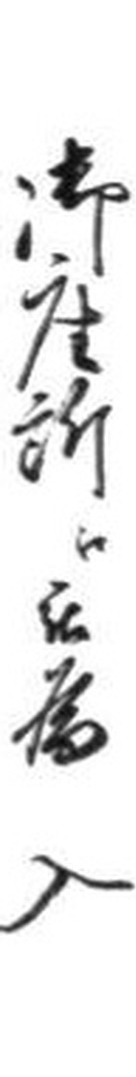御座所江被為入
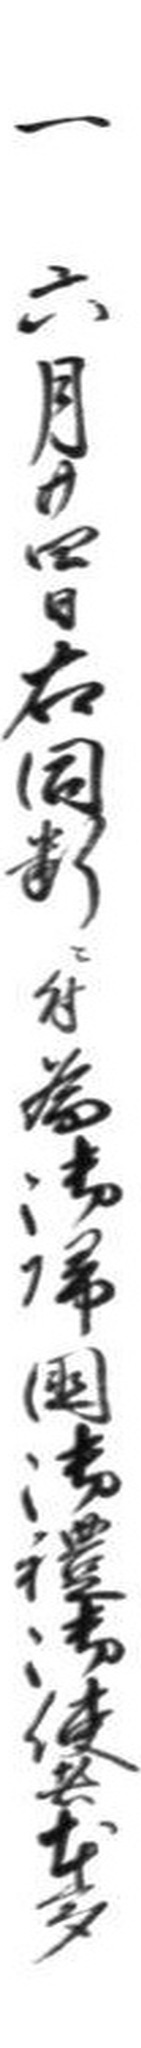一六月廿四日右同断ニ付為御帰国御礼御使者本多
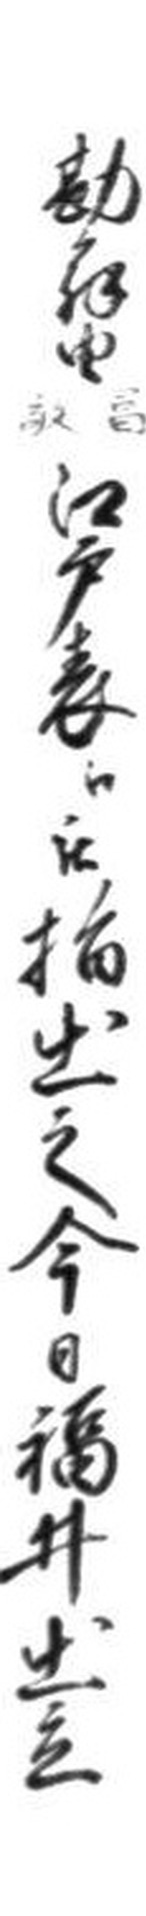勘解由富敬江戸表江被指出之今日福井出立
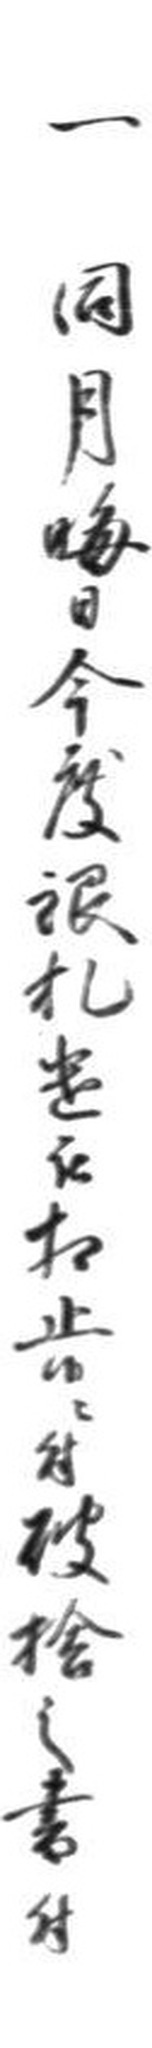一同月晦日今度銀札遣被相止候ニ付破捨之書付
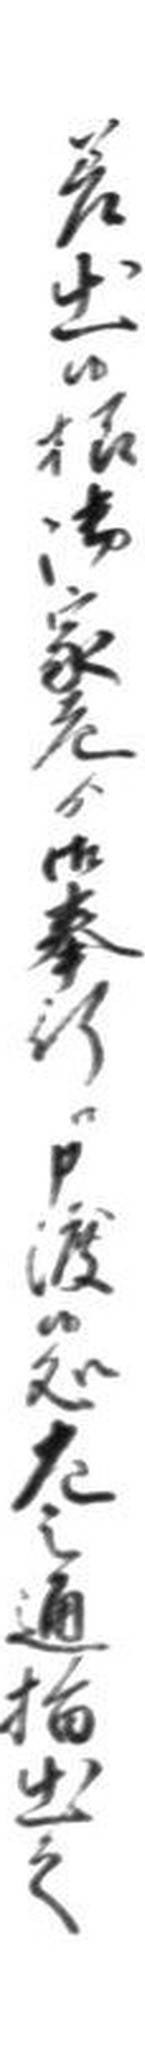差出候様御家老ゟ御奉行江申渡候処左之通指出之
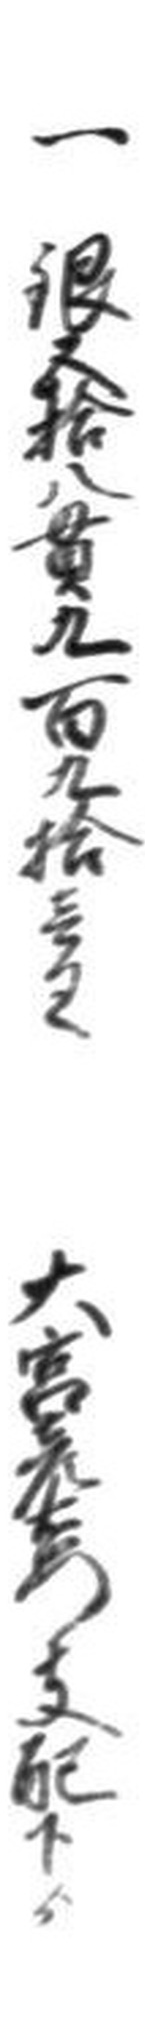一銀五拾八貫九百九拾壱匁大宮彦右衛門支配下ゟ
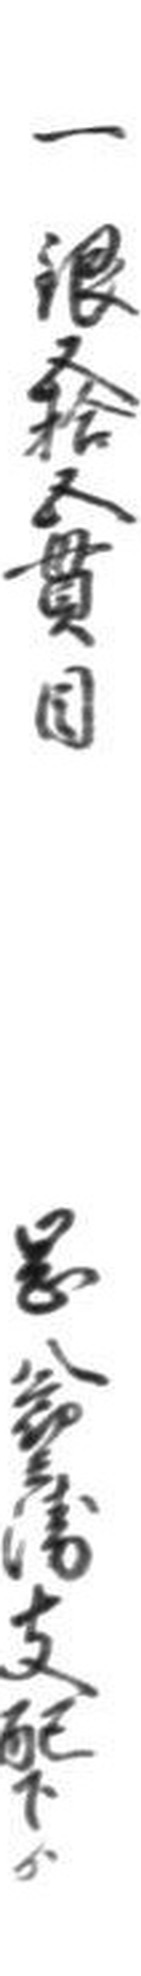一銀五拾五貫目岡八郎兵衛支配下ゟ
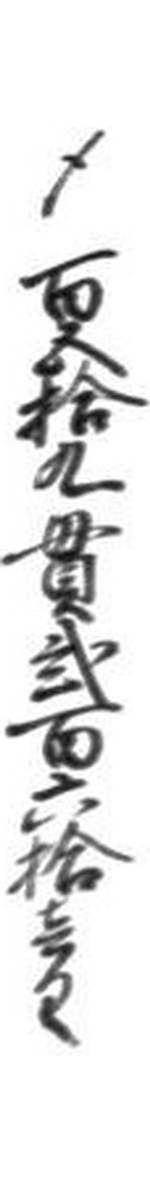〆百五拾九貫弐百六拾壱匁
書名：家譜 十六 吉品公 従貞享三年閏三月到同四年
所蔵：福井県文書館 Fukui Prefectural Archives
